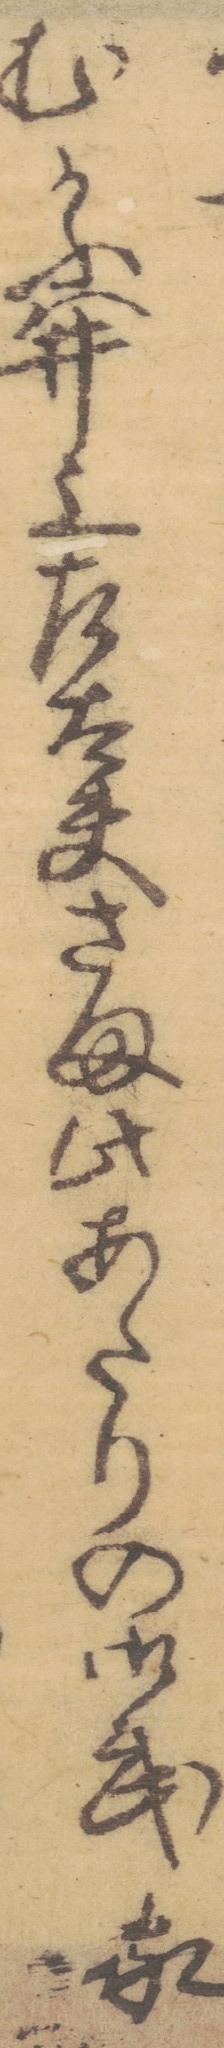むかふは井上左太夫さま此あたりの御武家
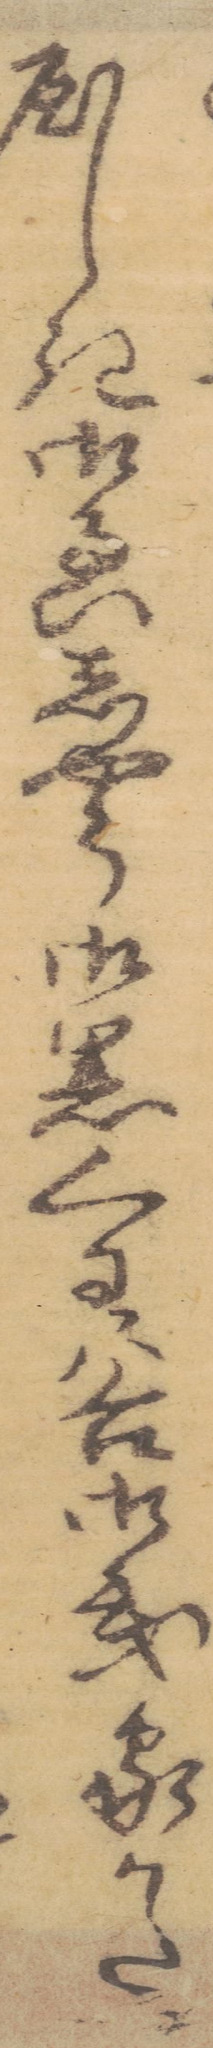屋しき御るいしやう御黒くに谷御義家かた
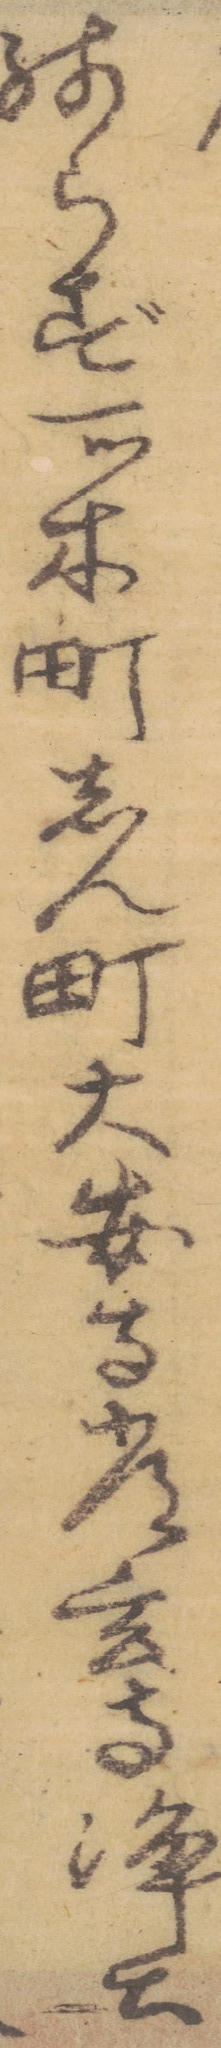残らず一ツ木町しん町大安寺常玄寺浄土
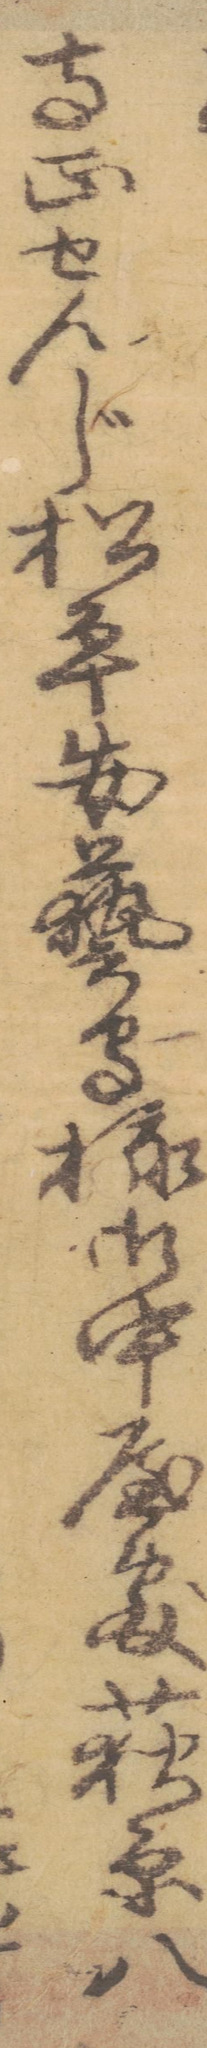寺正せんじ松平安芸守様御屋敷萩原八
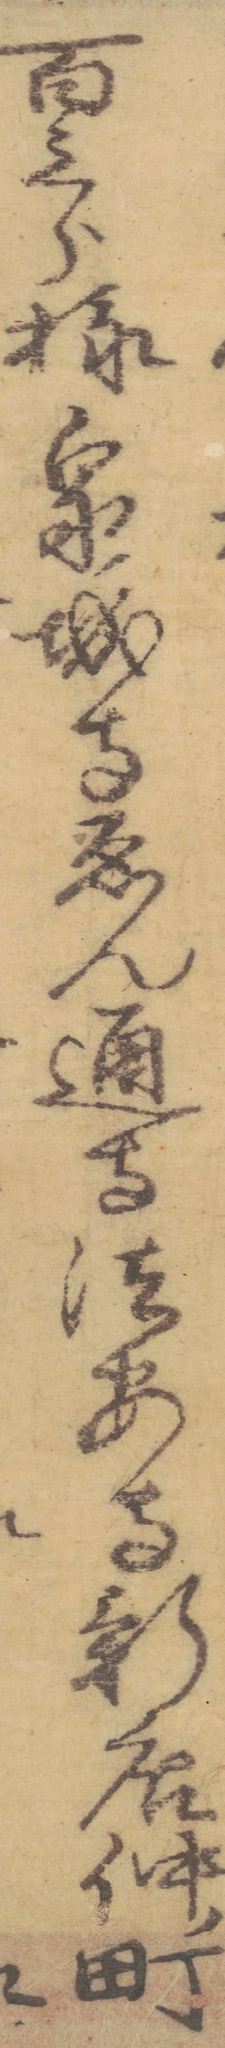百三郎様泉城寺ゑん通寺法安寺新店仲ノ町
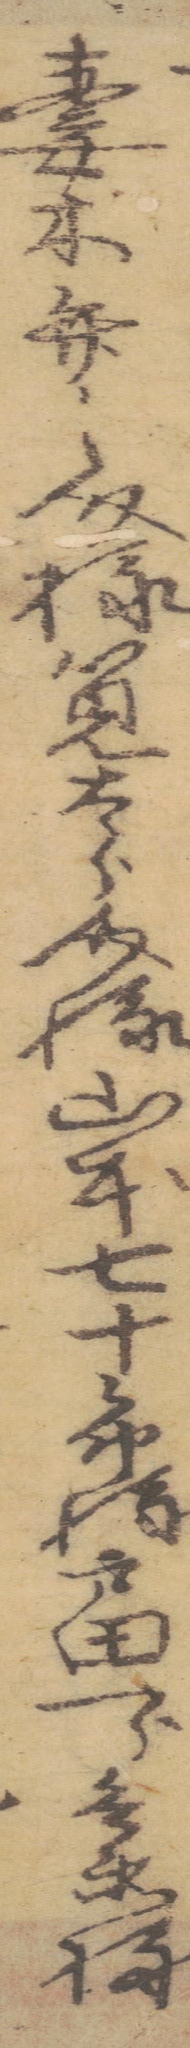妻木弁之介様筧太郎介様山本七十郎様戸田一郎兵衛様
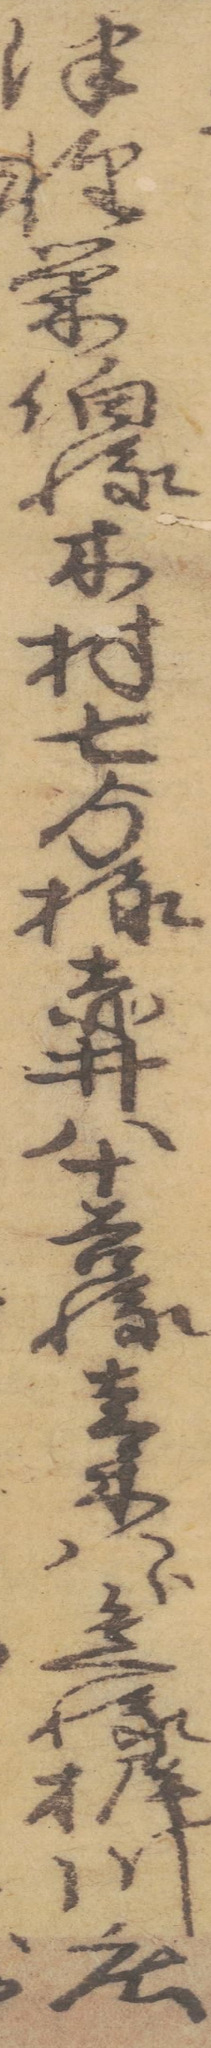津軽栄伯様木村七衛門様赤井八十吉様青木八郎兵衛様梶川庄
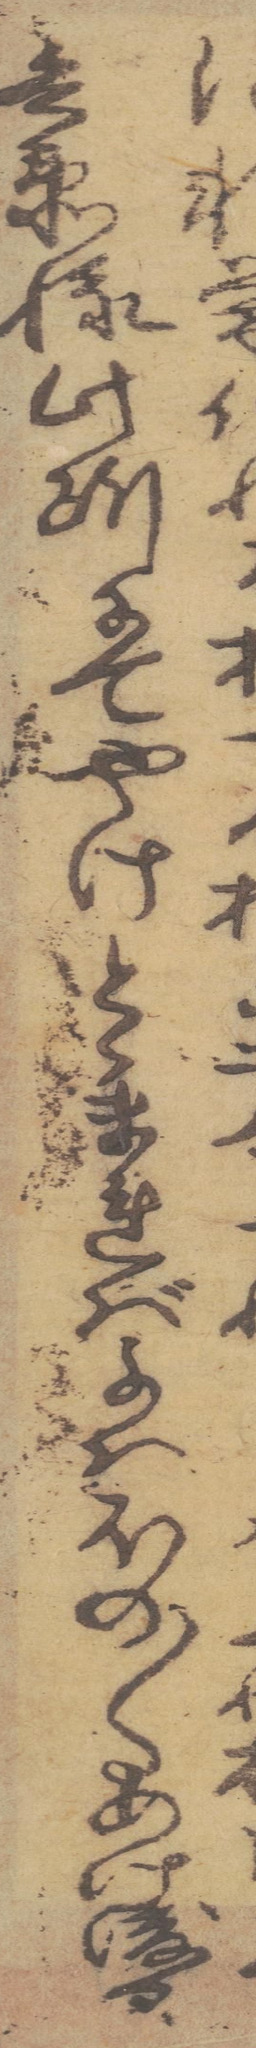兵衛様此所にてやけとまればよはほの〳〵あけ渡る
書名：類焼道しるべ
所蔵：東京大学地震研究所図書室 Earthquake Research Institute Library, The University of Tokyo, JAPAN
